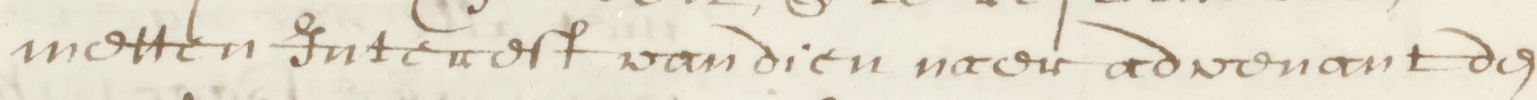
metten Interest van dien naer advenant den
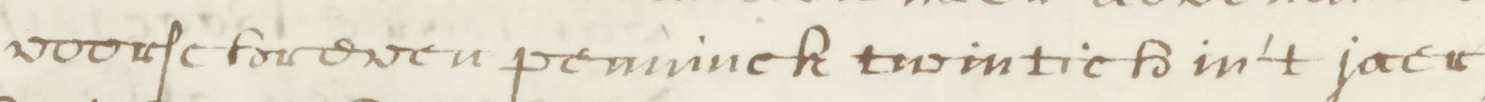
voorschreven penninck twintich in't jaer,
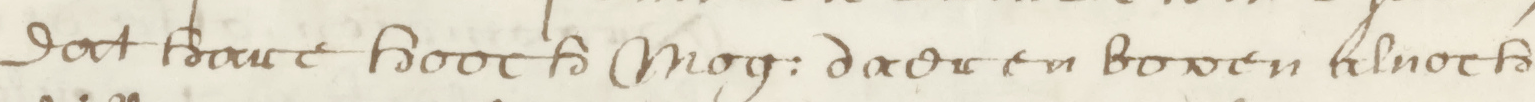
dat hare hooch Mog: daer en boven alnoch
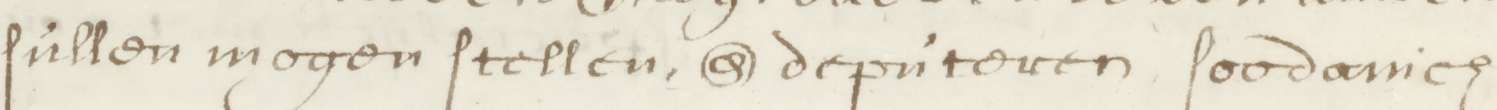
sullen mogen stellen, & deputeren, soodanich
